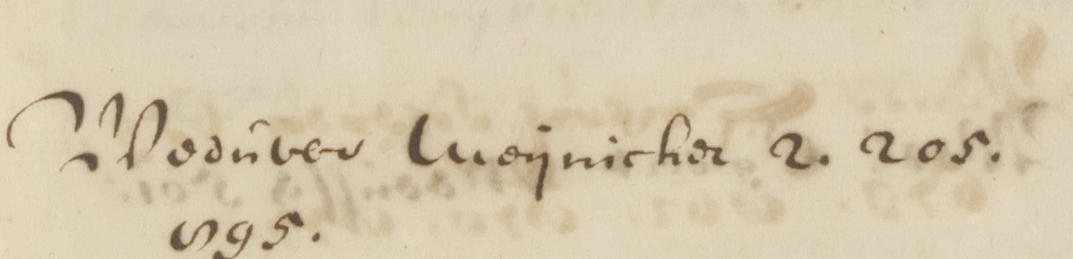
Weduwe Meijnicker 2. 205.
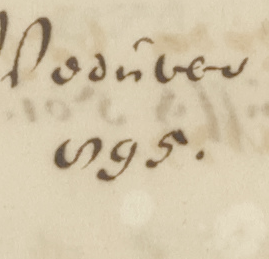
895.
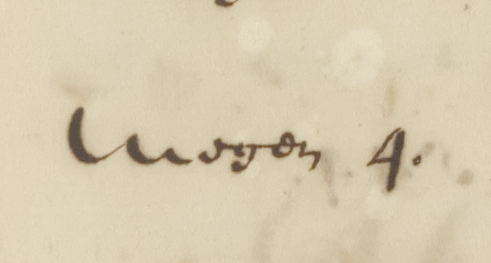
Megen 4.
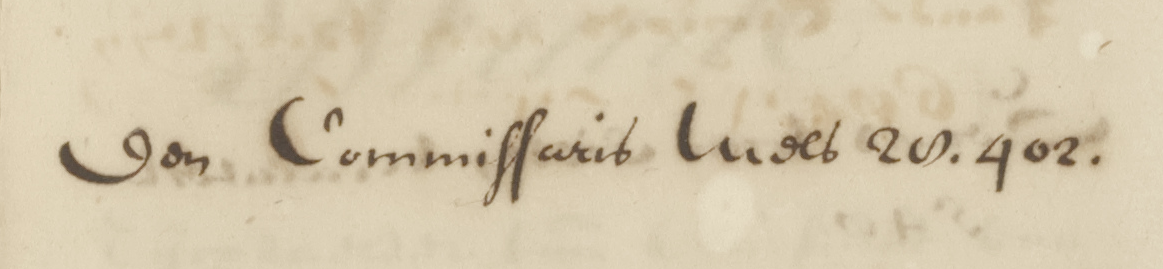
Den Commissaris Mels 28. 402.
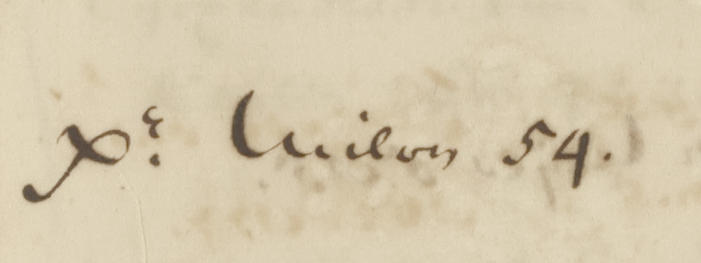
Pr. Milen 54.
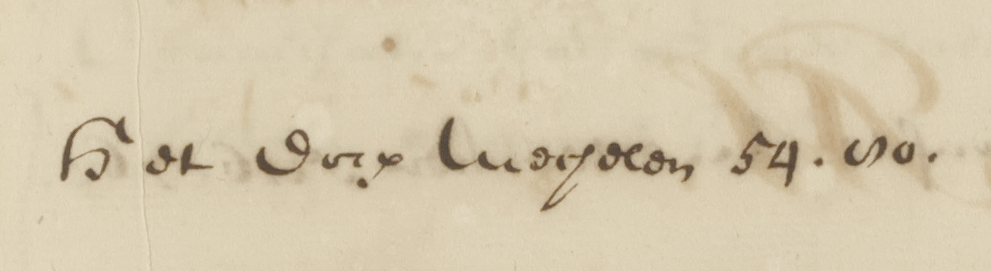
het Dorp Mechelen 54. 80.
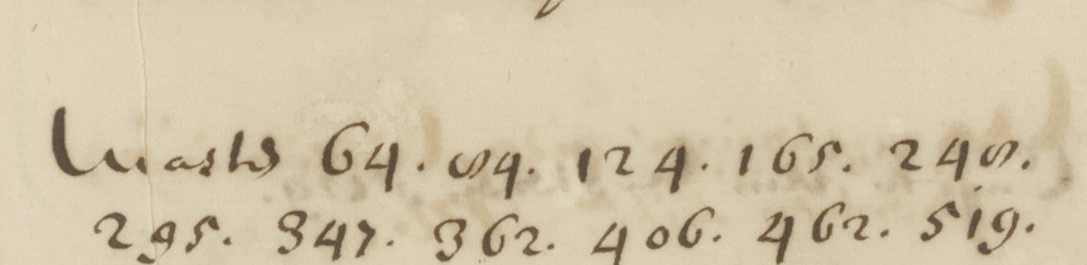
Masten 64. 84. 124. 165. 248.
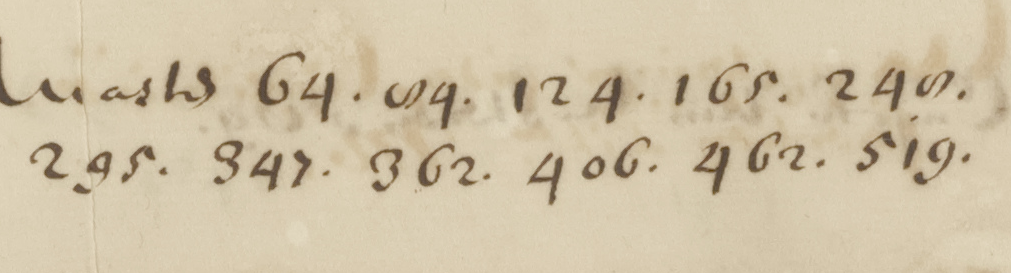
295. 347. 362. 406. 462. 519.
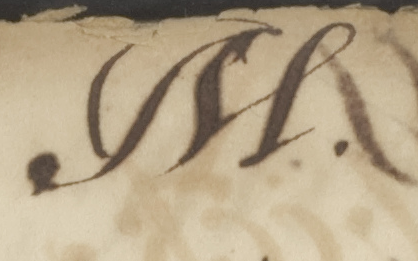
M.
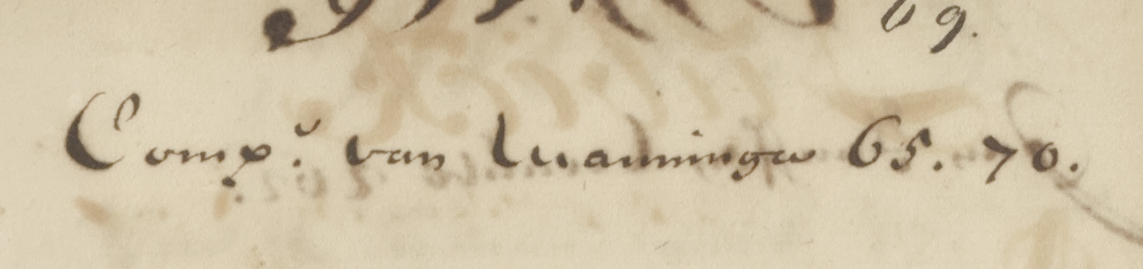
Compe. van Manninge 65. 70.
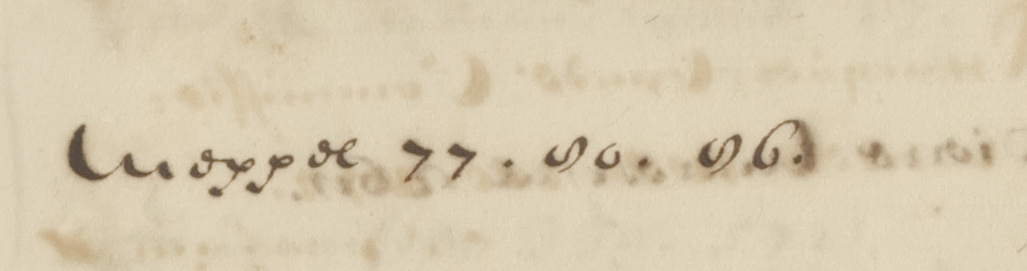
Meppel 77. 80. 86.
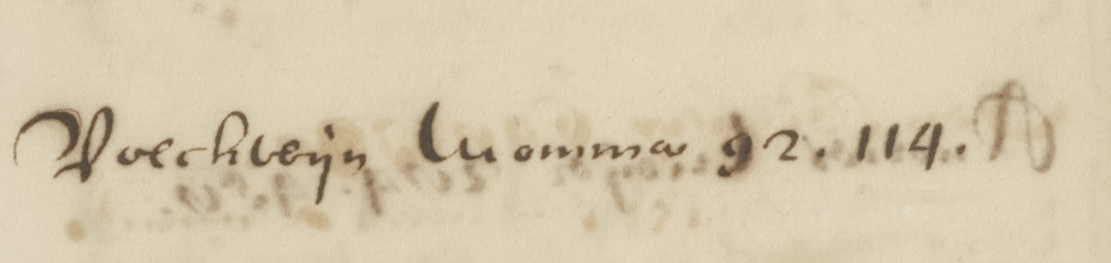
Volckwijn Momma 92. 114.
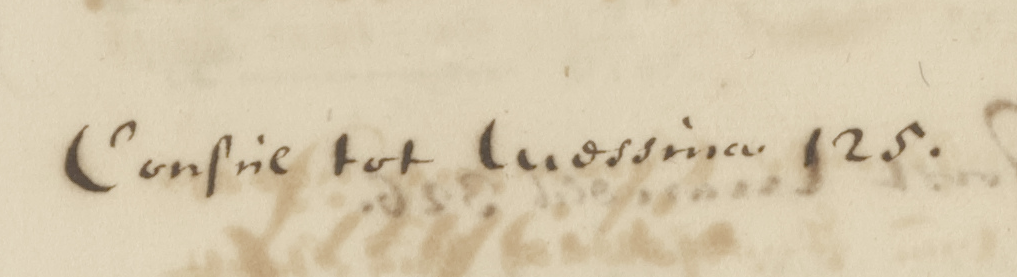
Consul tot Messina 125.
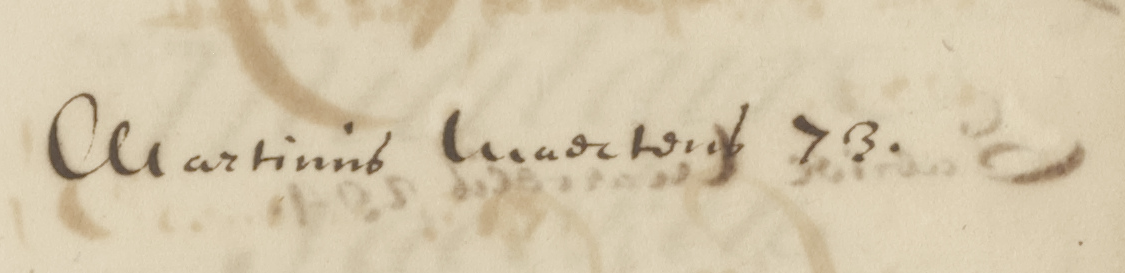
Martinus Maertens 73.
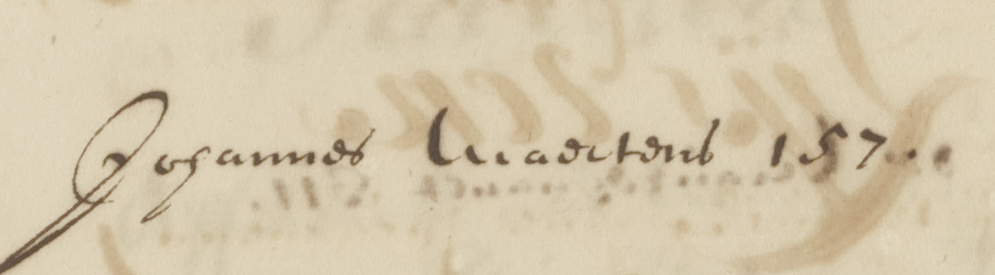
Johannes Maertens 157.
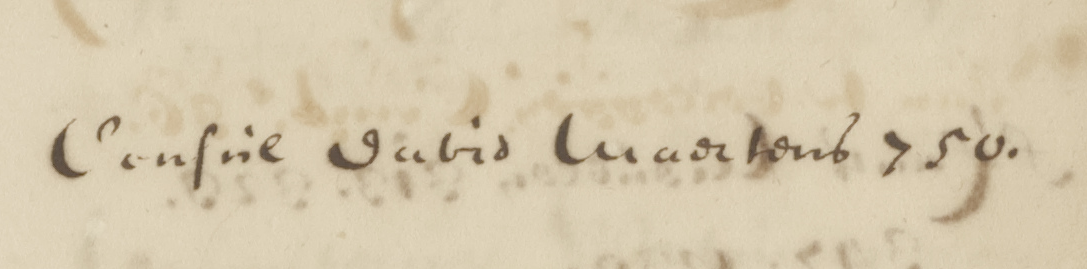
Consul Davis Maertens 759.
